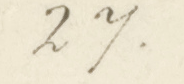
27.
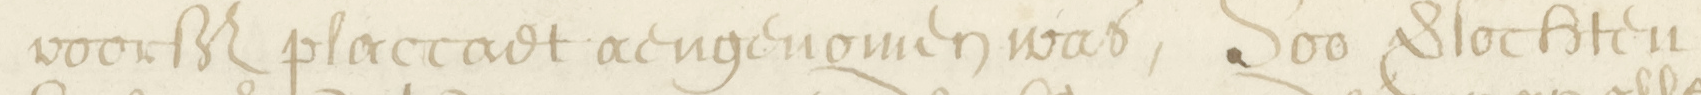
voorsz placcaet aengenomen was, soo vsochten
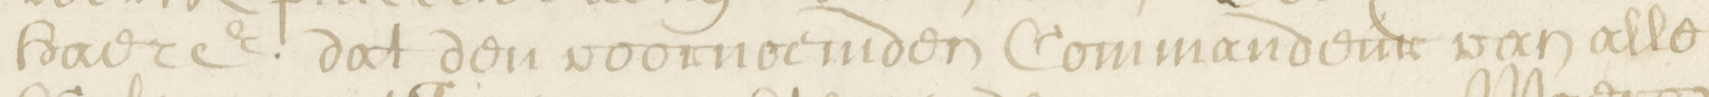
haer E. dat den voornoemden Commandeur van alle
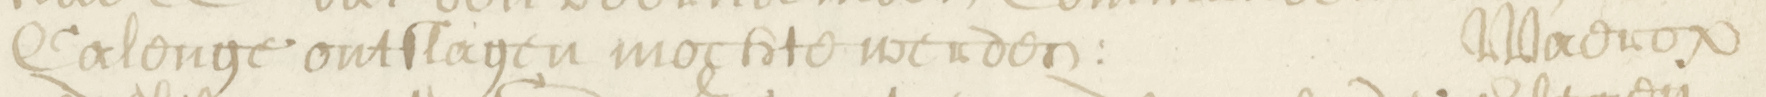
Calenge ontslagen mochte werden: Waerop
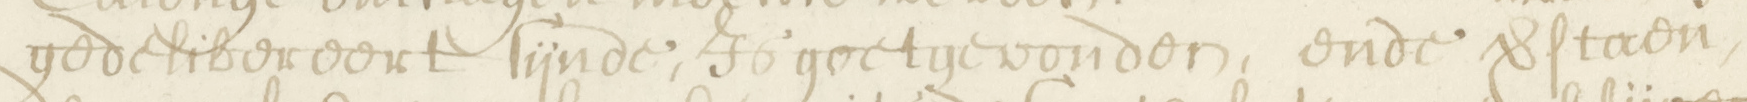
gedelibereert sijnde, is goetgevonden, ende vstaen,
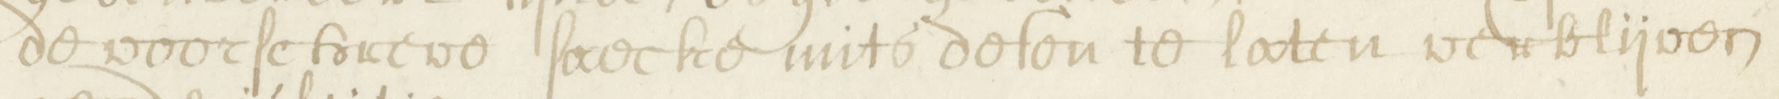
de voorschreve saecke mits desen te laten verblijven
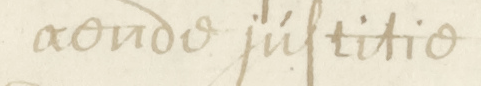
aende justitie
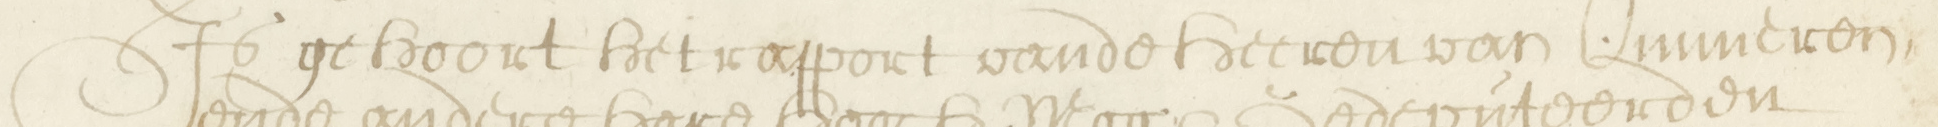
Is gehoort het rapport vande heeren van Ommeren,
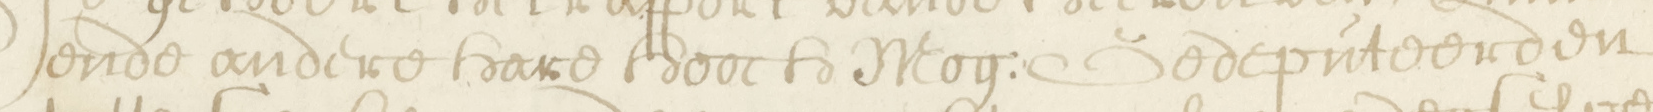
ende andere hare Hooch Mog: Gedeputeerden
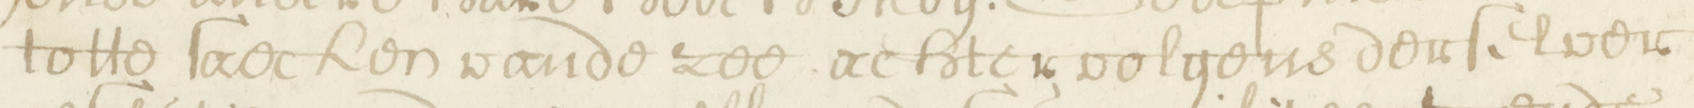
totte saecken vande zee achtervolgens derselver
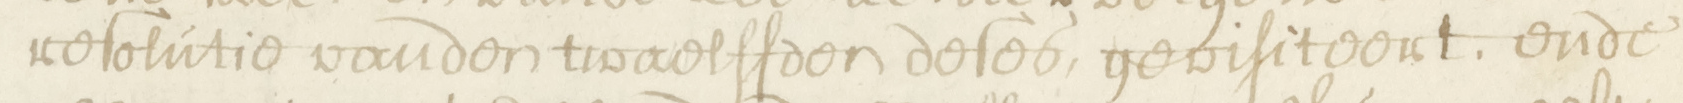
resolutie vanden twaelffden deses, gevisiteert, ende
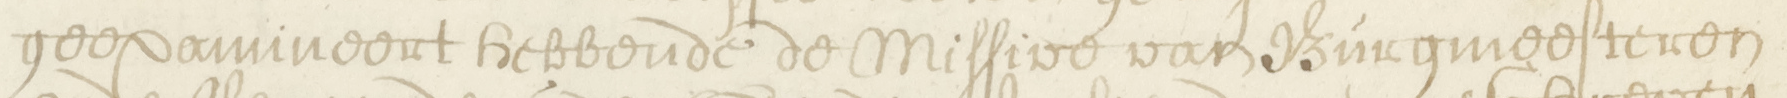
geexamineert hebbende de missive van Burgmeesteren
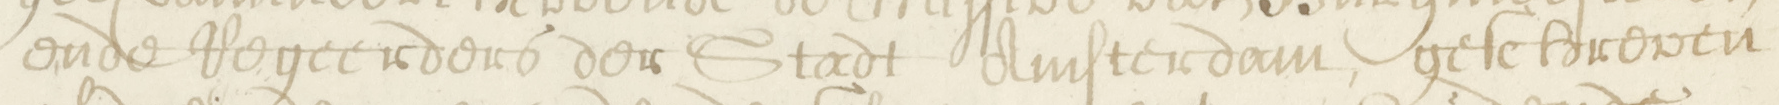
ende Regeerders der Stadt Amsterdam, geschreven
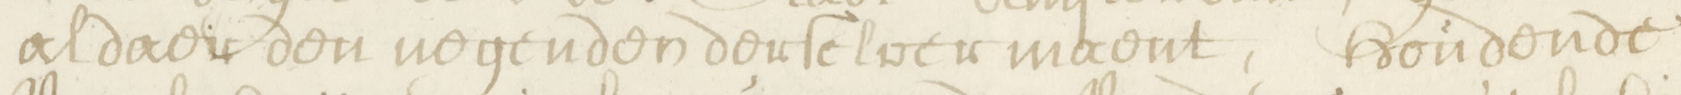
aldaer den negenden derselver maent, houdende
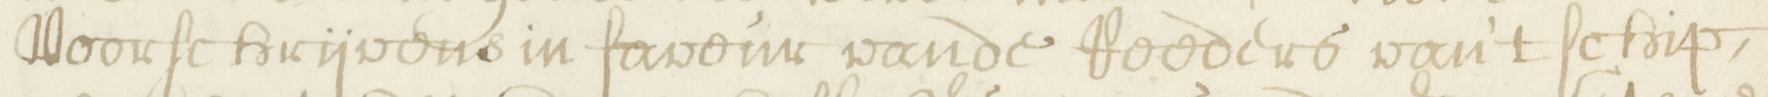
Voorschrijvens in faveur vande Reeders van't schip,
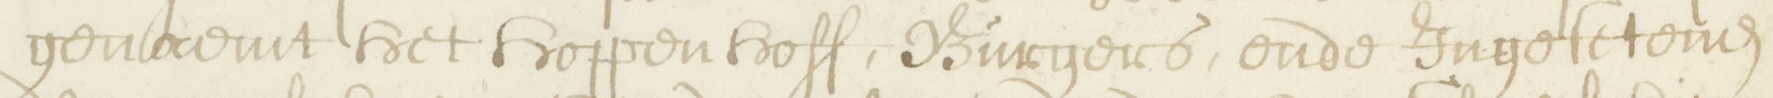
genaemt het hoppenhoff, Burgers, ende ingesetenen
